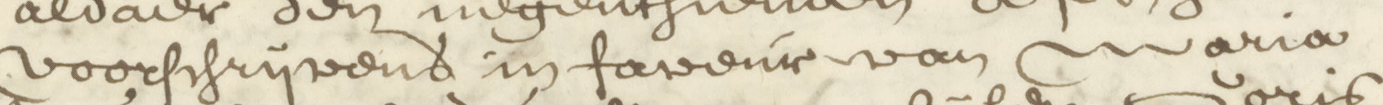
voorschrijvens in faveur van Maria
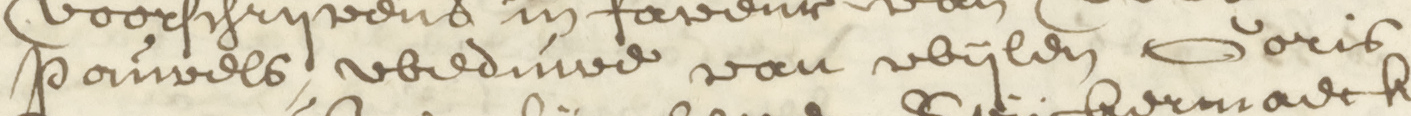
Pouwels, weduwe van wijlen Goris
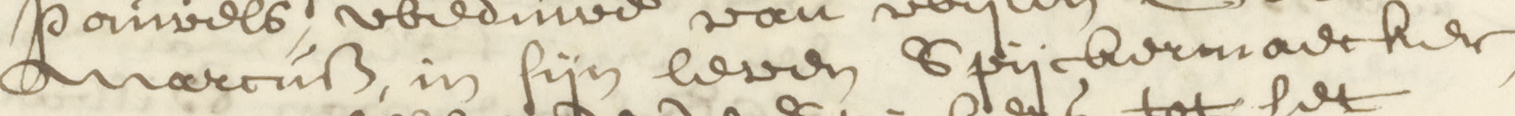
Marcusz, in sijn leven Spijckermaecker,
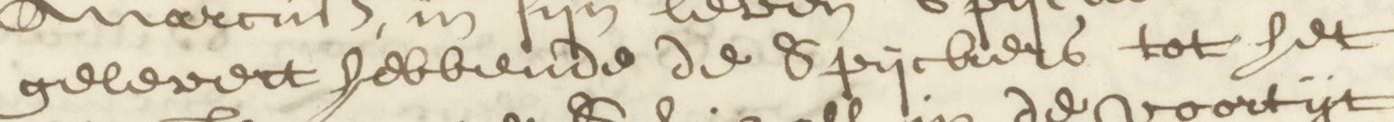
gelevert hebbende de Spijckers tot het
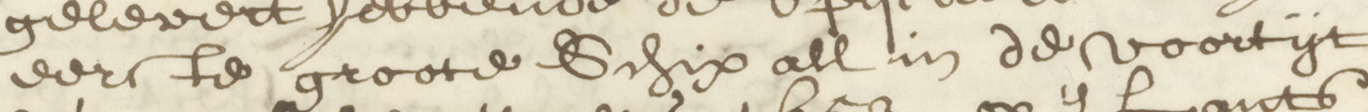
eerste groote Schip all in de voortijt
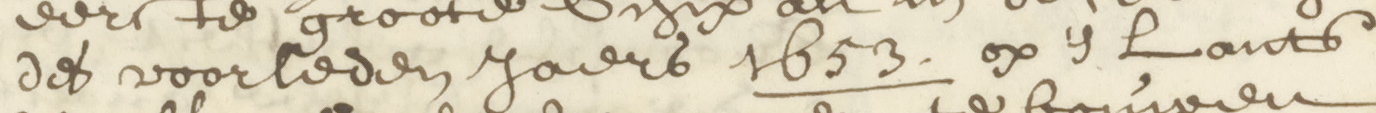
des voorleden Jaers 1653. op ‛s Lants
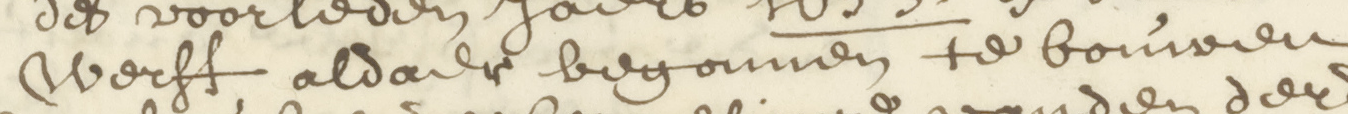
Werff, aldaer begonnen te bouwen
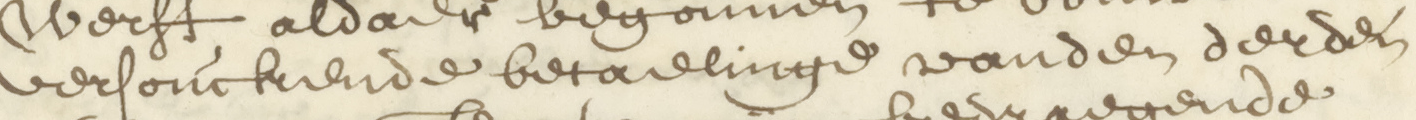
versouckende betaelinge vanden derden
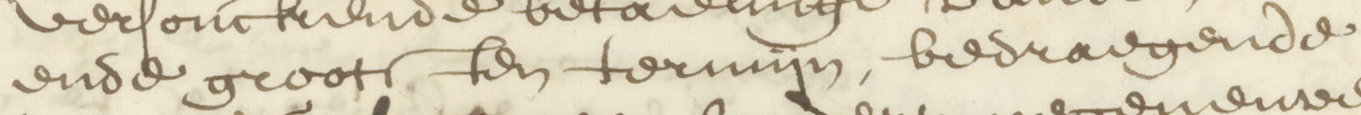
ende grootsten termijn, bedraegende
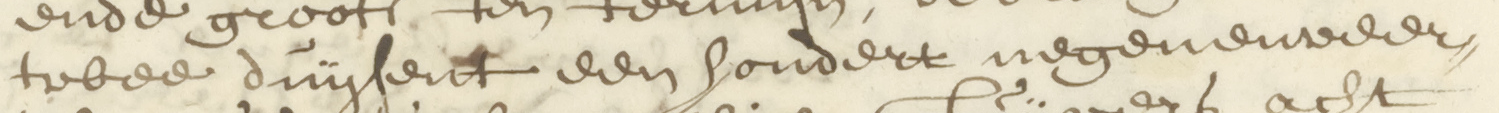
twee duijsent een hondert negenenveer„
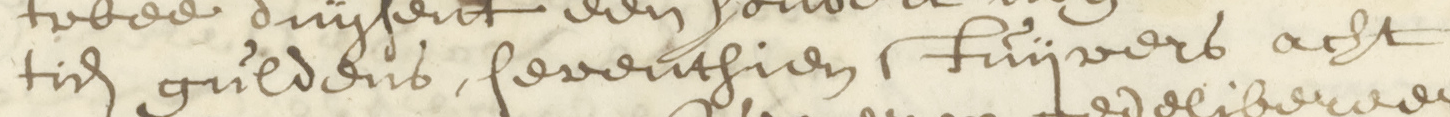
tich guldens, seventhien stuijvers acht
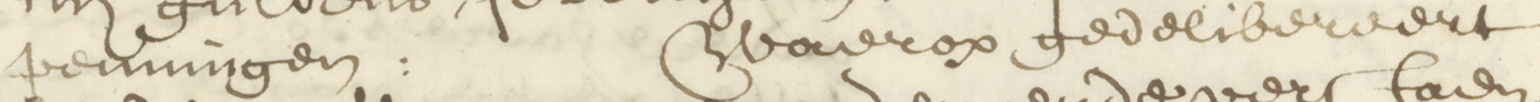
penningen: Waerop gedelibereert
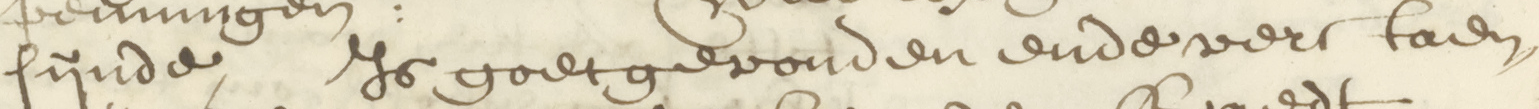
sijnde, Is goetgevonden ende verstaen,
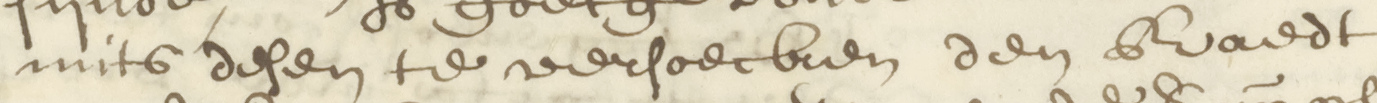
mits desen te versoecken den Raedt
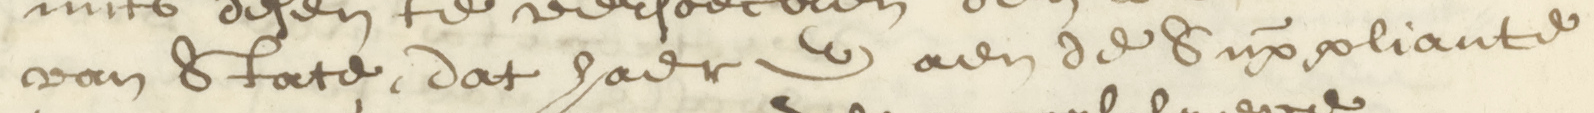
van State, dat haer E. aen de Suppliante
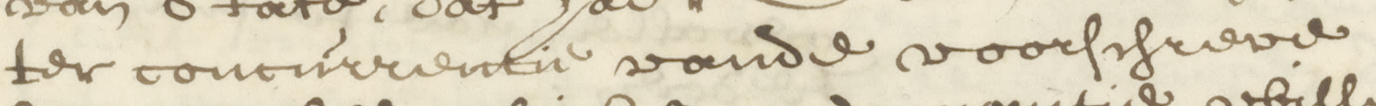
ter concurrentie vande voorschreve
